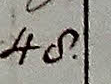48.
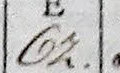62.
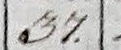37.
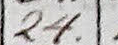24.
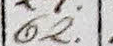62.
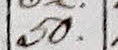50.
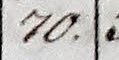70.
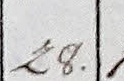28.
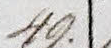49.
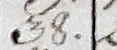38.
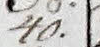40.
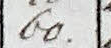60.
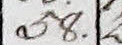58.
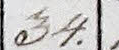34.
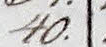40.
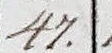47.
